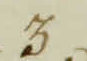3
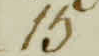15
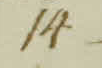14
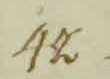42
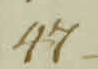47
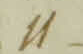11
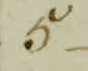5
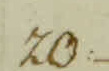20
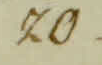20
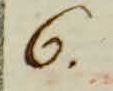6.
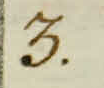3.
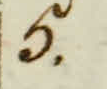5.
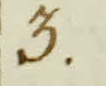3.
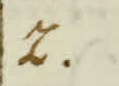2.
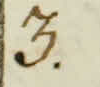3.
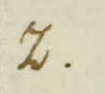2.
